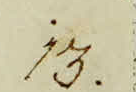13.
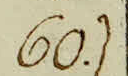60.
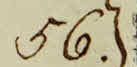56.
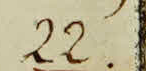22.
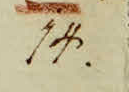14.
